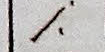1.
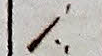1.
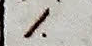1.
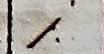1.
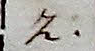2.
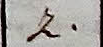2.
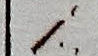1.
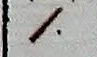1.
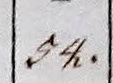54.
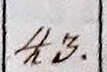43.
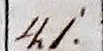41.
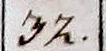32.
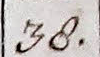38.
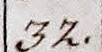32
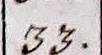33.
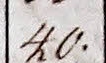40.
